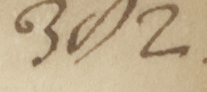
382
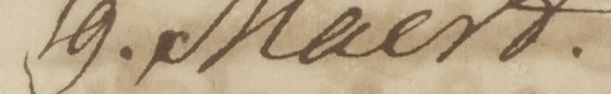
19. Maert.
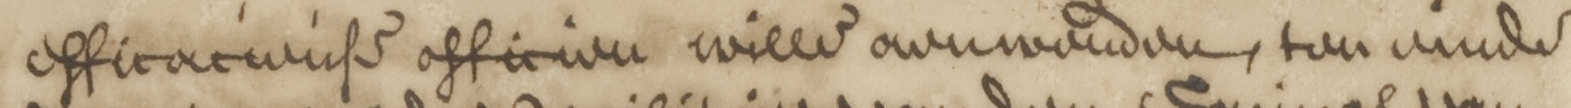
officacieuse officien wille aenwenden, ten einde
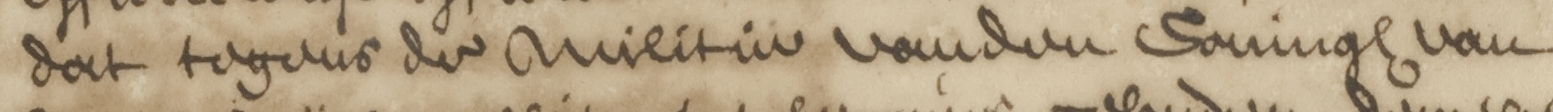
dat tegens de Militie vanden Coningh van
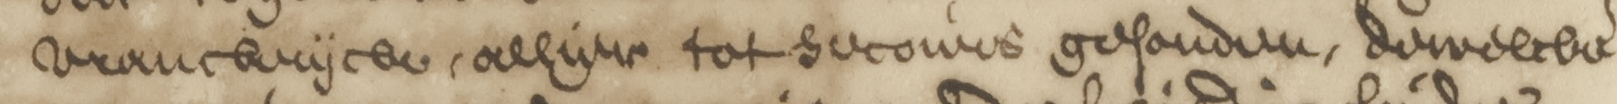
vranckrijck, alhier tot secours gesonden, dewelcke
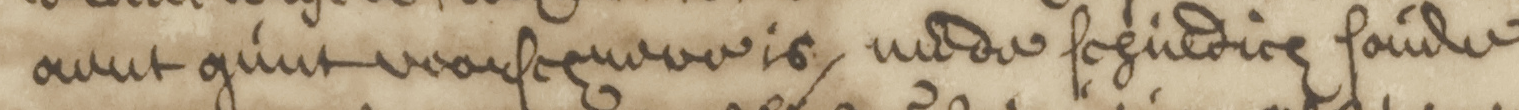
aent gunt voorschreve is, mede schuldich soude
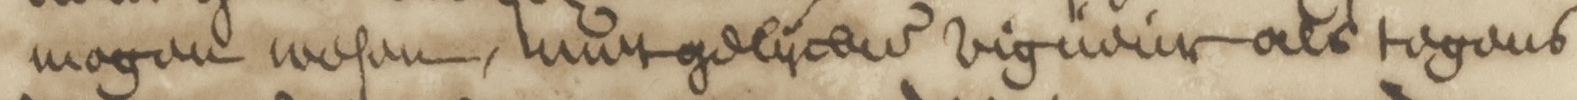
mogen wesen, mietgelijcke vigueur als tegens
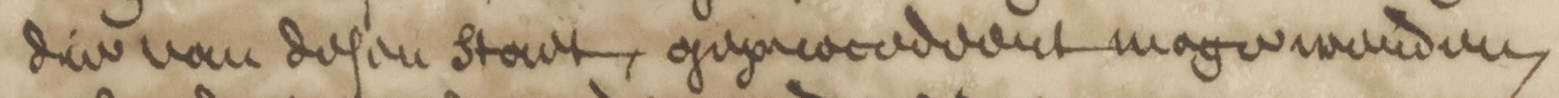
die van desen staet, geprocedeert moge werden,
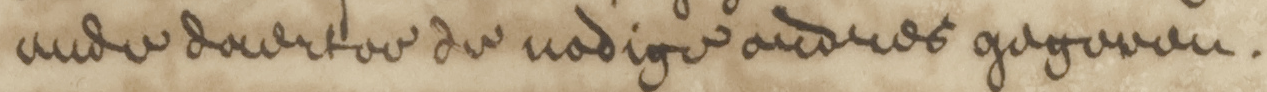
ende daertoe de nodige ordres gegeven,
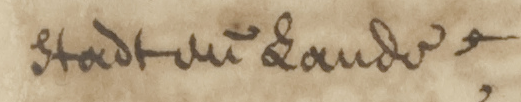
stadt en Lande
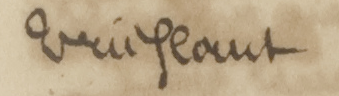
Vrieslant
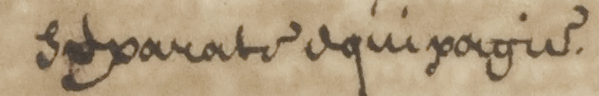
separate equipagie
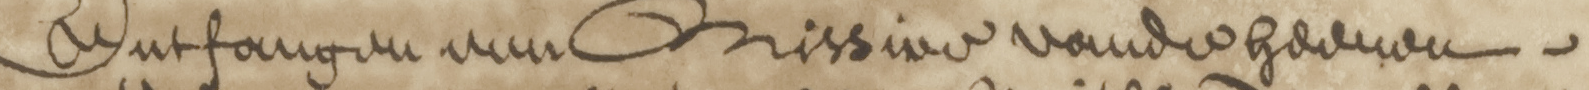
Ontfangen een Missive vande heeren
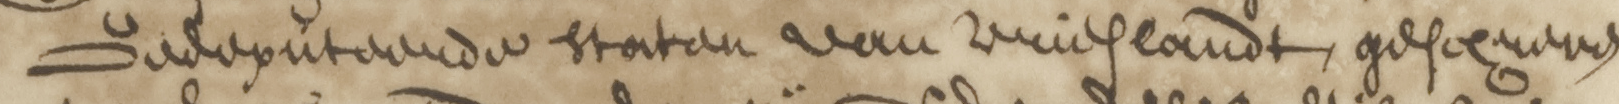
Gedeputeerde Staten van Vrieslandt, geschreve
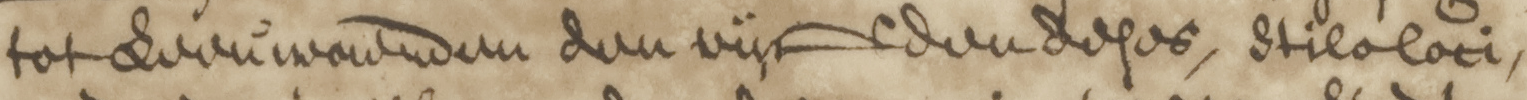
tot Leeuwaerden den vijffden deses, stiloloci,
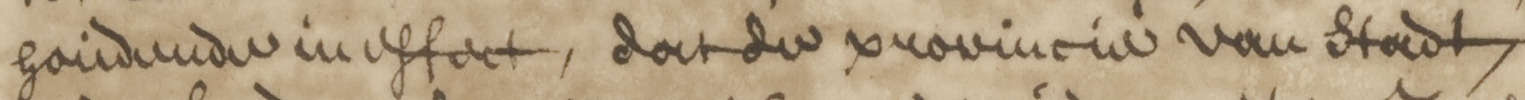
houdende in effect, dat de provincie van Stadt,
